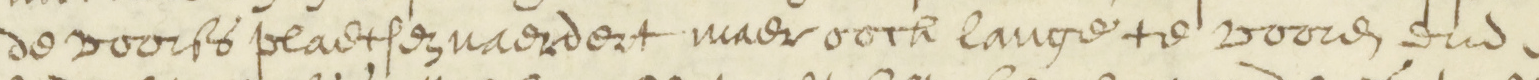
de voors plaetsen naerdert maer oock lange te vooren ende
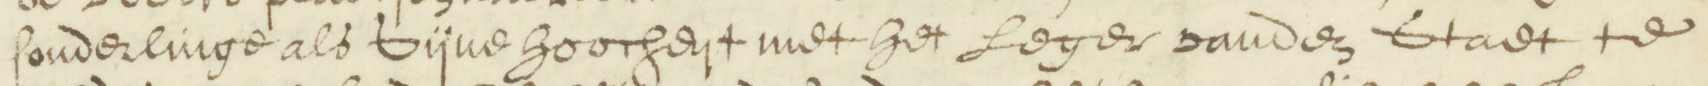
sonderlinge als Sijne hoocheyt met het Leger vanden Staet te
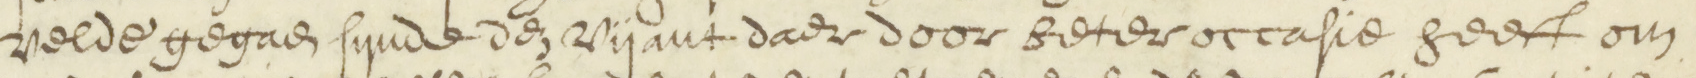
velde gegaen synde den Vijant daer door beter occasie heeft om
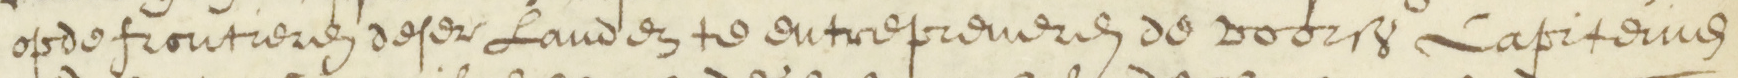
opde frontieren deser Landen te entrepreneren de voors Capiteinen
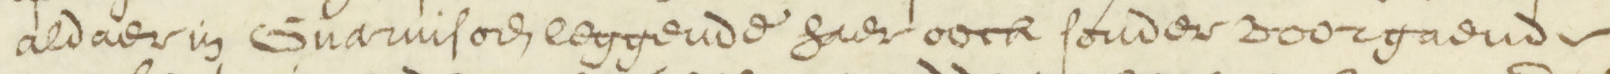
aldaer in Guarnisoen leggende haer oock sonder voorgaende
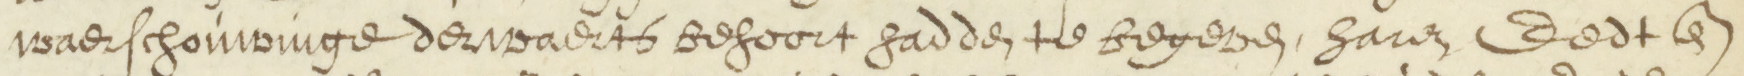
waerschouwinge derwaerts behoort hadden te begeven, haren Eedt &
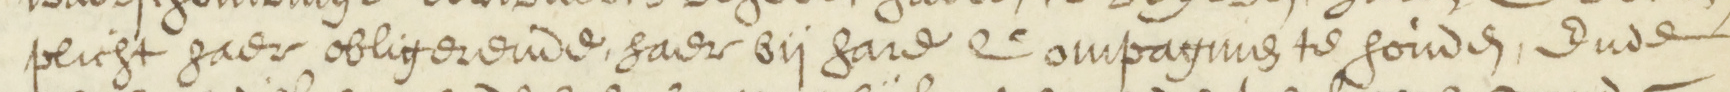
plicht haer obligerende, haer bij hare Compagnien te houden. Ende
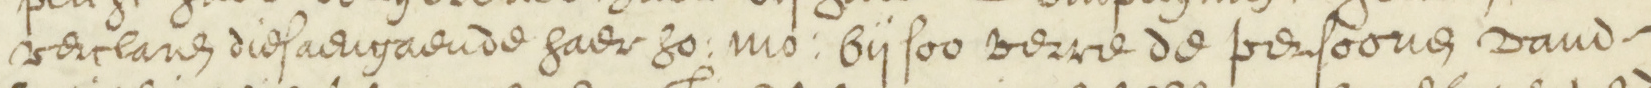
verclaren diesaengaende haer ho:mo: bij soo verre de persoonen vande
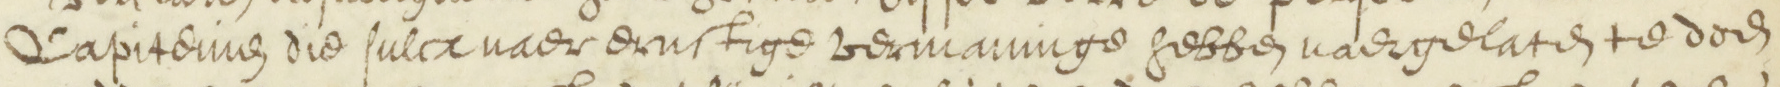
Capiteinen die sulcx naer ernstige vermaninge hebben naergelaten te doen
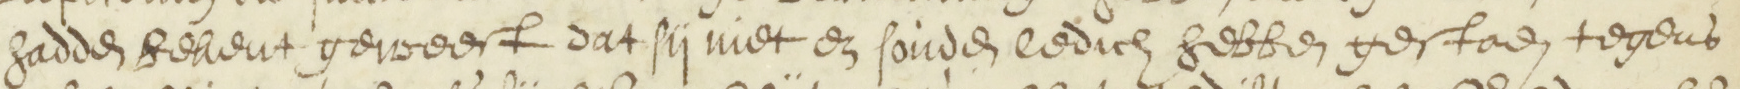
hadden bekent geweest dat sij niet en souden ledich hebben gestaen tegens
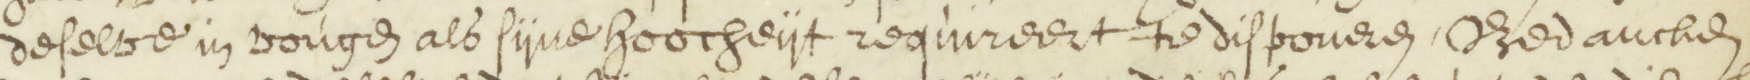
deselve in vougen als sijne hoocheijt requireert te disponeren. Bedancken
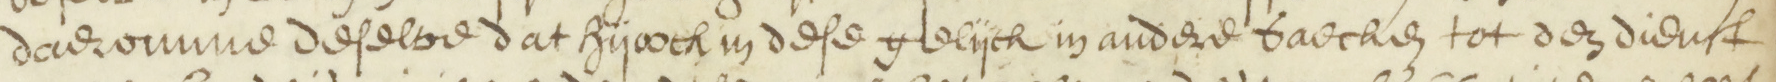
daeromme deselve dat hij oock in dese gelijck in andere Saecken tot den dienst
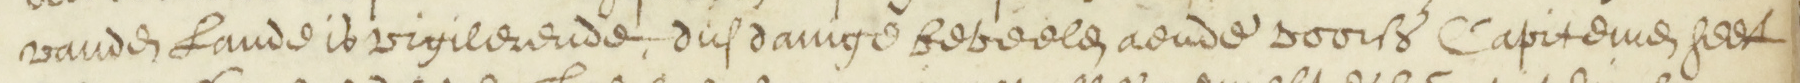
vanden Lande is vigilerende, dusdanige beveelen aende voors Capiteinen heeft
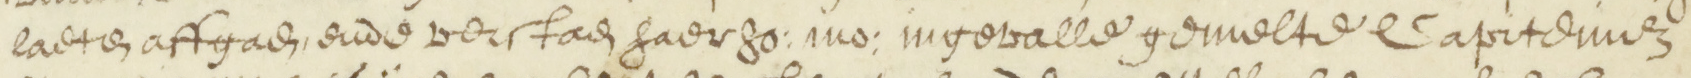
laeten affgaen ende verstaen haer ho:mo: ingevalle gemelte Capiteinen
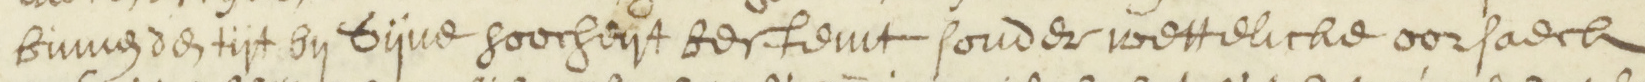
binnen den tijt by Sijne hoocheyt bestemt sonder wettelicke oorsaeck
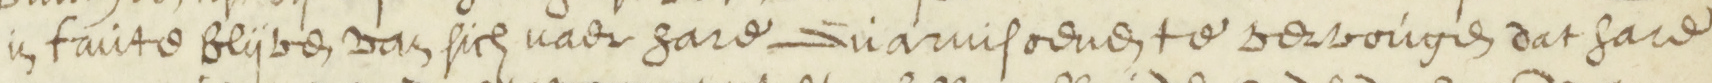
in faute blijven van sich naer hare Guarnisoenen te vervougen dat hare
